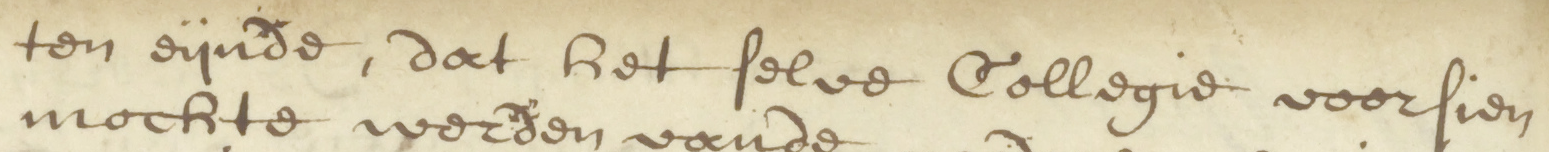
ten eijnde, dat het selve Collegie voorsien
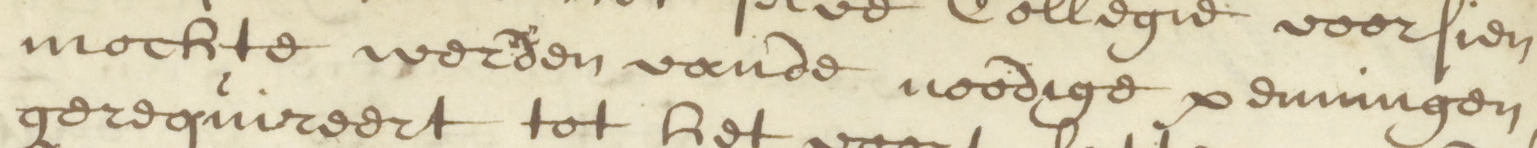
mochte werden vande noodige penningen,
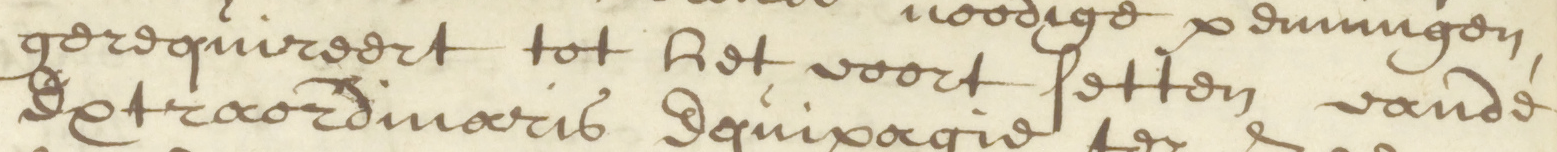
gerequireert tot het voort setten vande
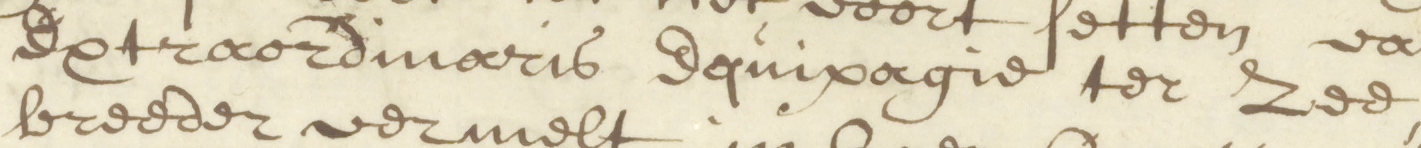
Extraordinaris Equipagie ter Zee,
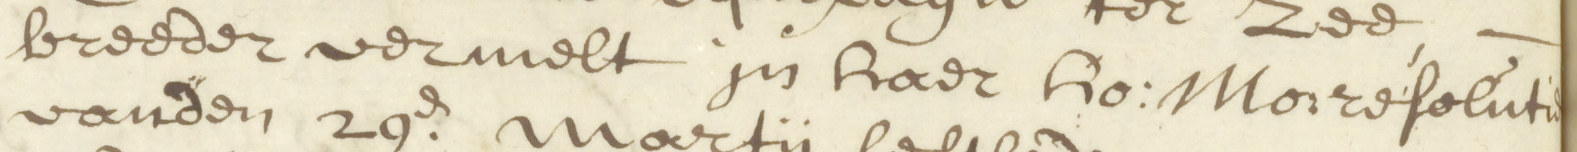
breeder vermelt in haer Ho:Mo: resolutie
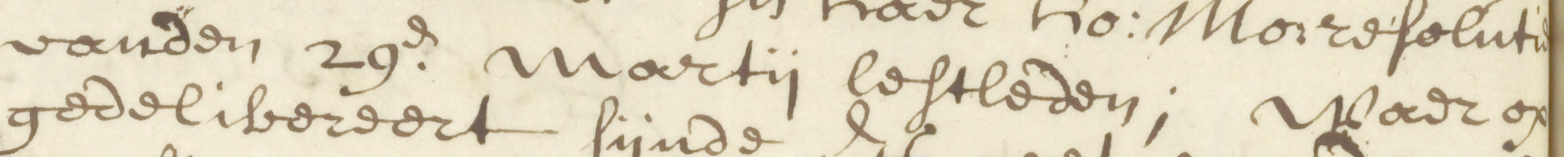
vanden 29en. Martij lestleden; Waerop
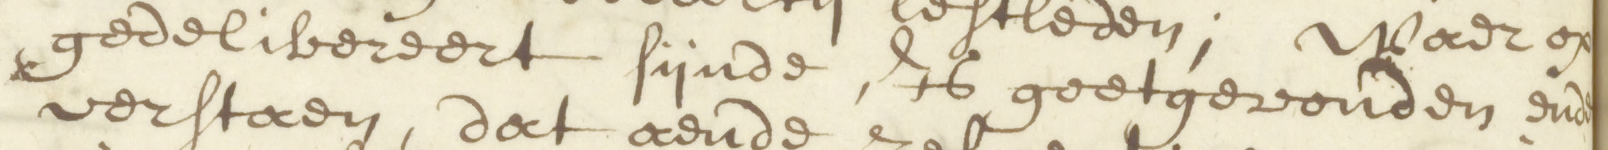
gedelibereert sijnde, Is goetgevonden ende
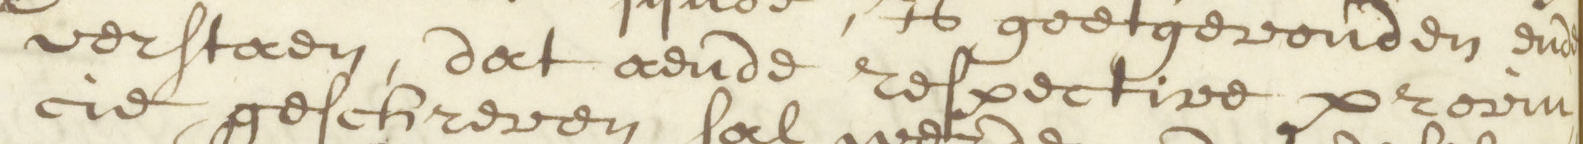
verstaen, dat aende respective provin„
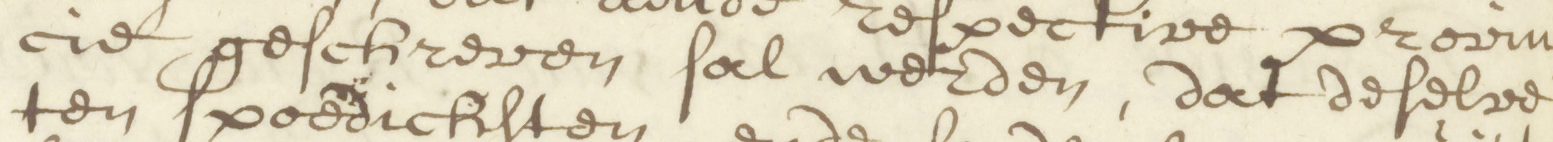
cie geschreven sal werden, dat deselve
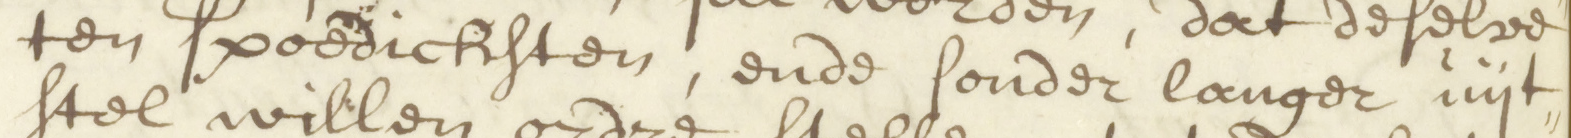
ten spoedichsten, ende sonder langer uijt„
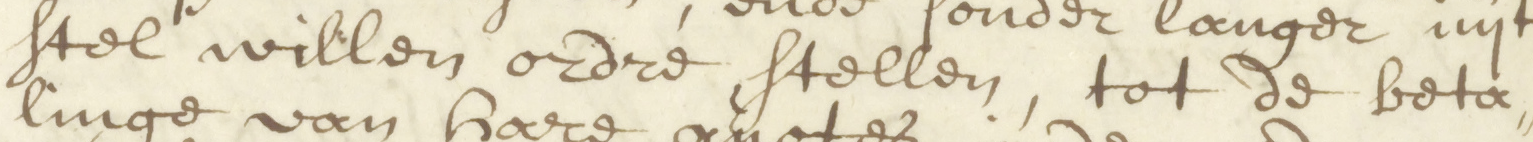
stel willen ordre stellen, tot de beta„
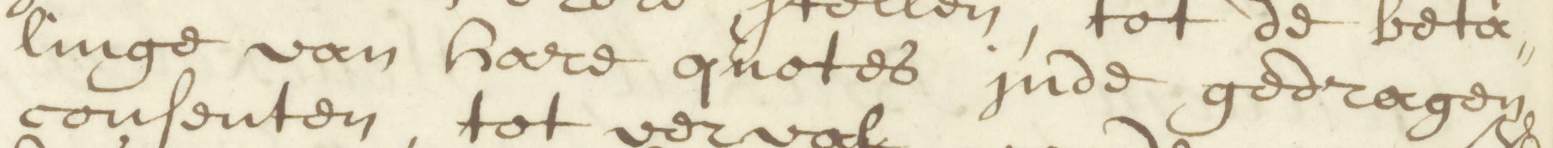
linge van hare quotes inde gedragen
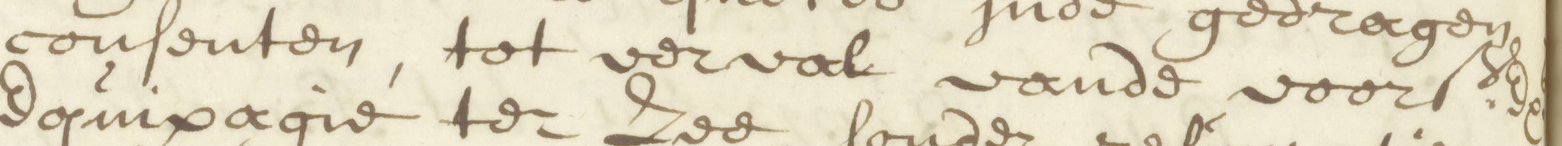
consenten tot verval vande voors. Ex.
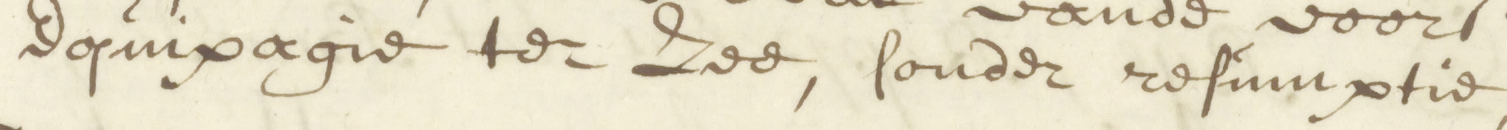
Equipagie ter Zee, sonder resumptie.
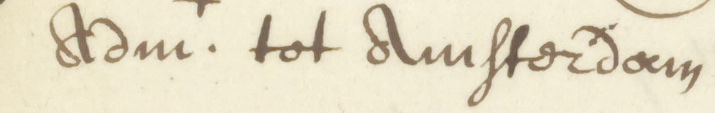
Admt. tot Amsterdam
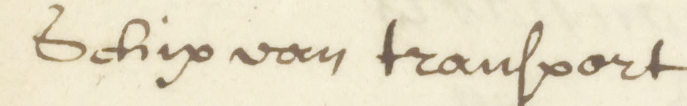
Schip van transport
